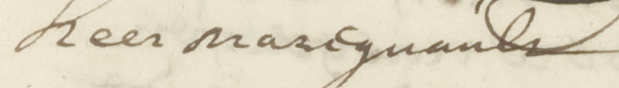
Heer maregnault
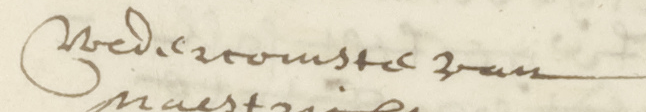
Wedercomste van
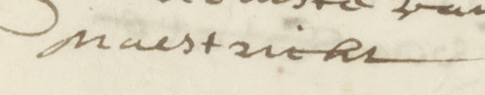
maestricht
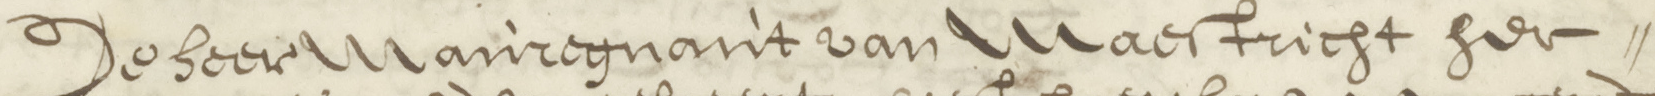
De heer Mauregnaut van Maestricht her„
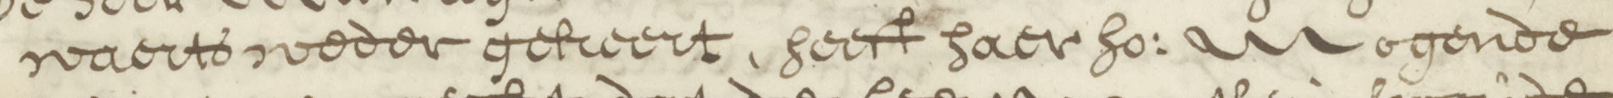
waerts weder gekeert, heeft haer ho:Mogende
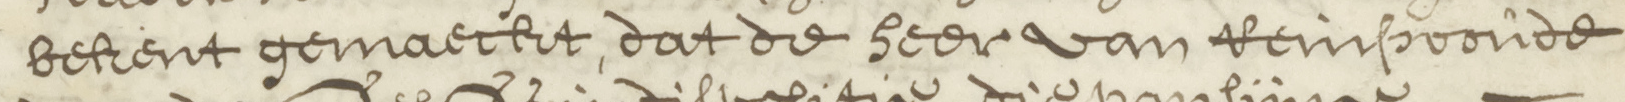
bekent gemaeckt, dat de heer van Reinswoude
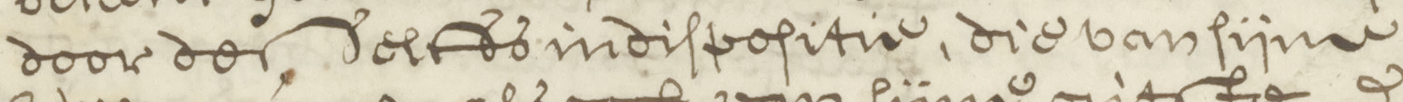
door desselffs indispositie, die van sijne
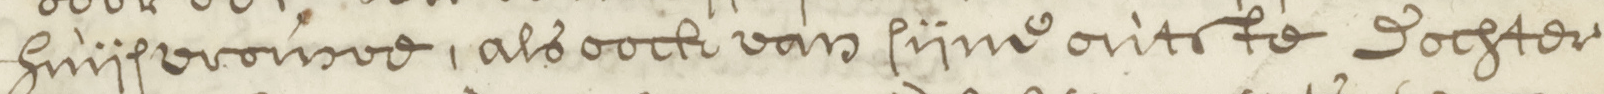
huijsvrouwe, als oock van sijne outste Dochter
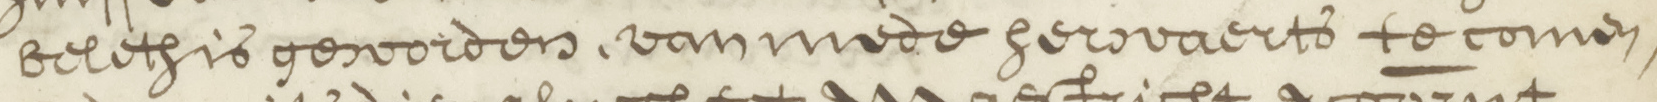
beleth is geworden, van mede herwaerts te comen,
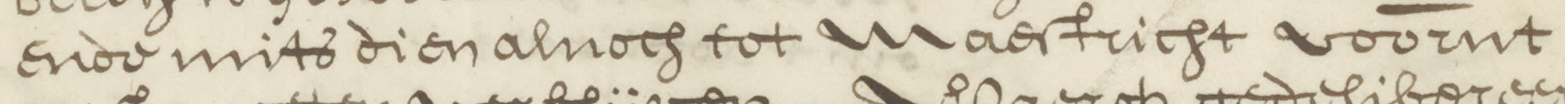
ende mitsdien alnoch tot Maestricht voornt
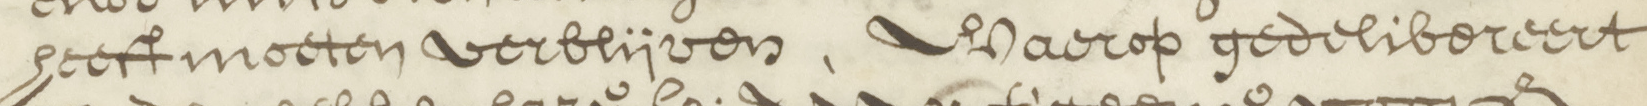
heeft moeten verblijven. Waerop gedelibereert
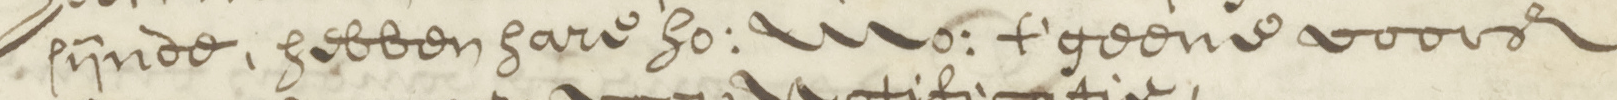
sijnde, hebben hare ho:Mo: t'geene voors
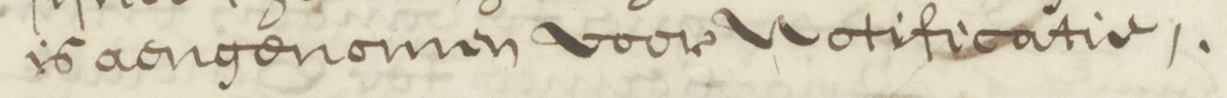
is aengenomen voor Notificatie.
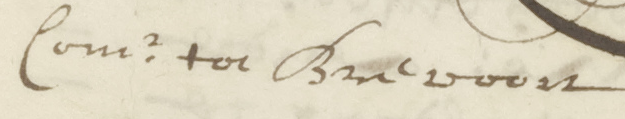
Comr tot Brevoort
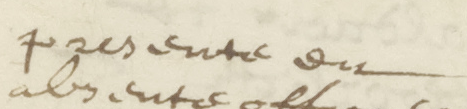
presente en
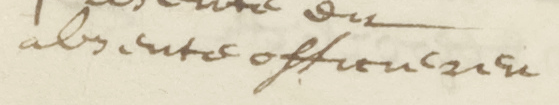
absente officieren
